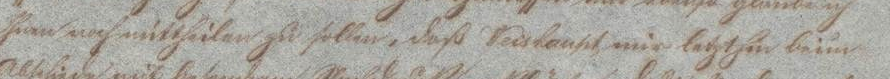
Ihnen noch mittheilen zu sollen, daß Weishaupt mir letzthin bei'm
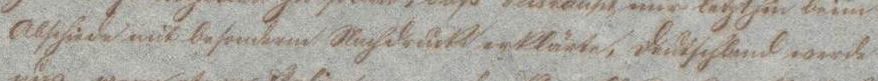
Abschiede mit besonderm Nachdrucke erklärte, Deutschland werde
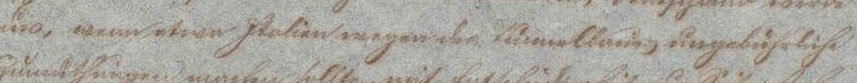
uns, wenn etwa Italien wegen des Tunnelbaues ungebührliche
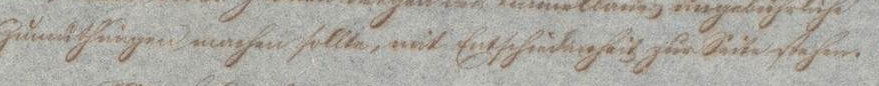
Zumuthungen machen sollte, mit Entschiedenheit zur Seite stehen.
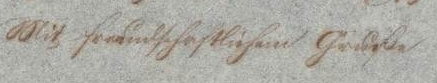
Mit freundschaftlichem Gruße
